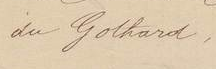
du Gothard,
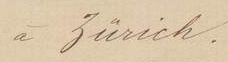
à Zürich.
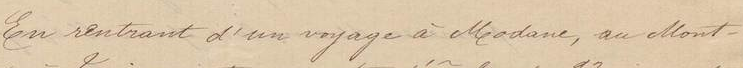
En rentrant d'un voyage à Modane, au Mont-
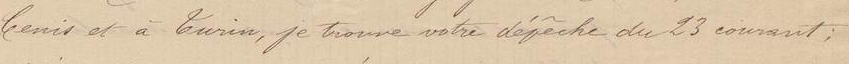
Cenis et à Turin, je trouve votre dépêche du 23 courant;
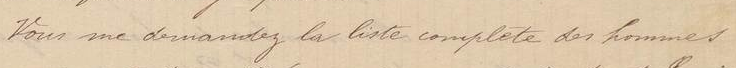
Vous me demandez la liste complète des hommes
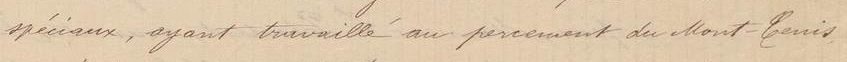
spéciaux, ayant travaillé au percement du Mont–Cenis
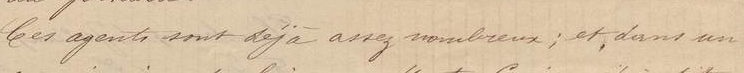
Les agents sont déjà assez nombreux; et dans un
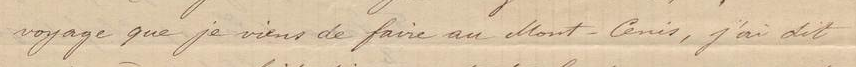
voyage que je viens de faire au Mont–Cenis, j'ai dit
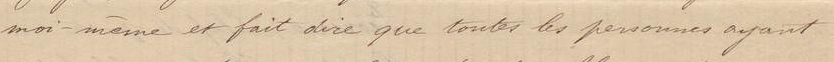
moi-mème et fait dire que toutes les personnes ayant
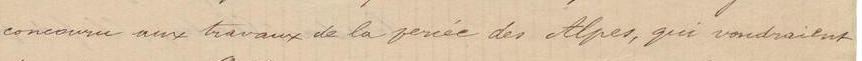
concouru aux travaux de la percée des Alpes, qui voudraient
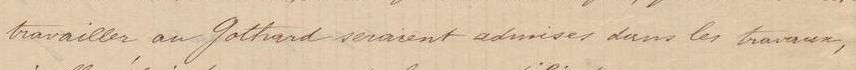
travailler au Gothard seraient admises dans les travaux,
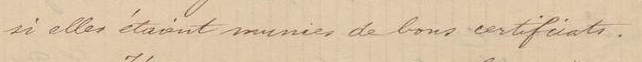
si elles étaient munies de bons certificats.
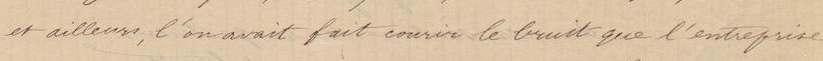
et ailleurs, l'on avait fait courir le bruit que l`entreprise
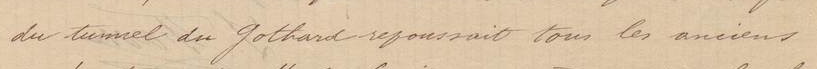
du tunnel du Gothard repoussait tous les anciens
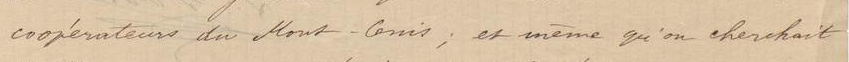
coopérateurs du Mont–Cenis; et mème qu'on cherchait
